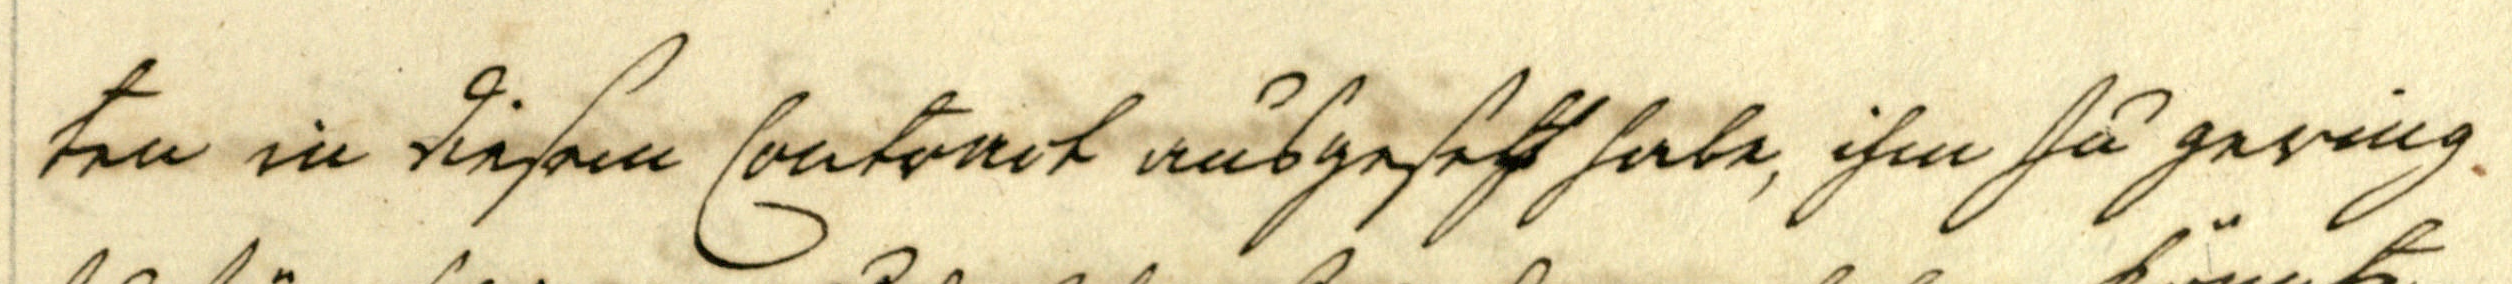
ten in diesem Contract ausgesetzt habe, ihm zu gering
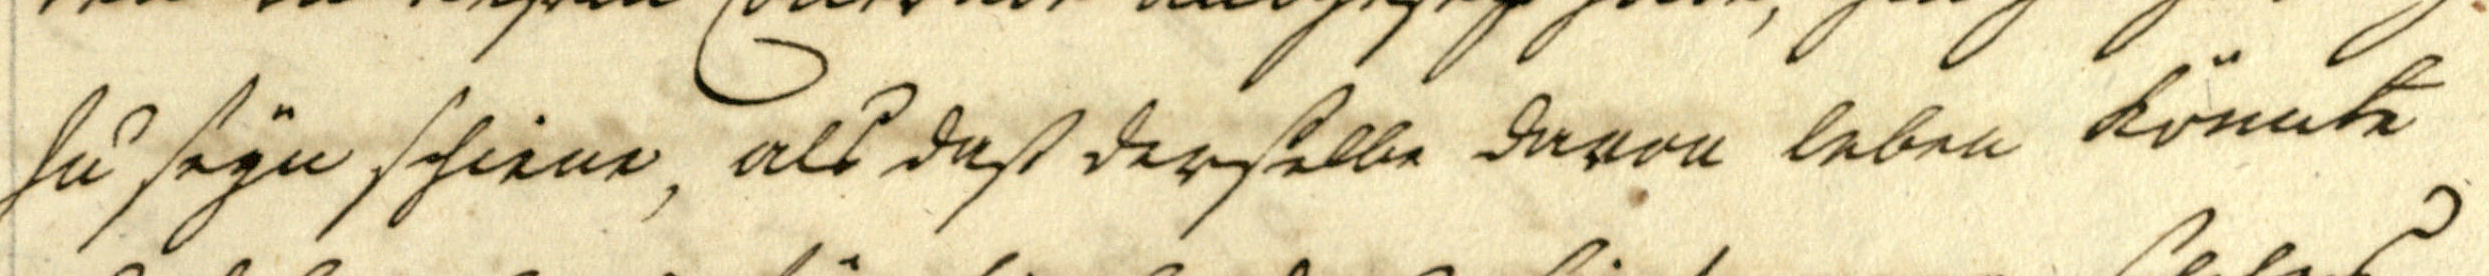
zu seÿn schiene, als daß derselbe davon leben könnte
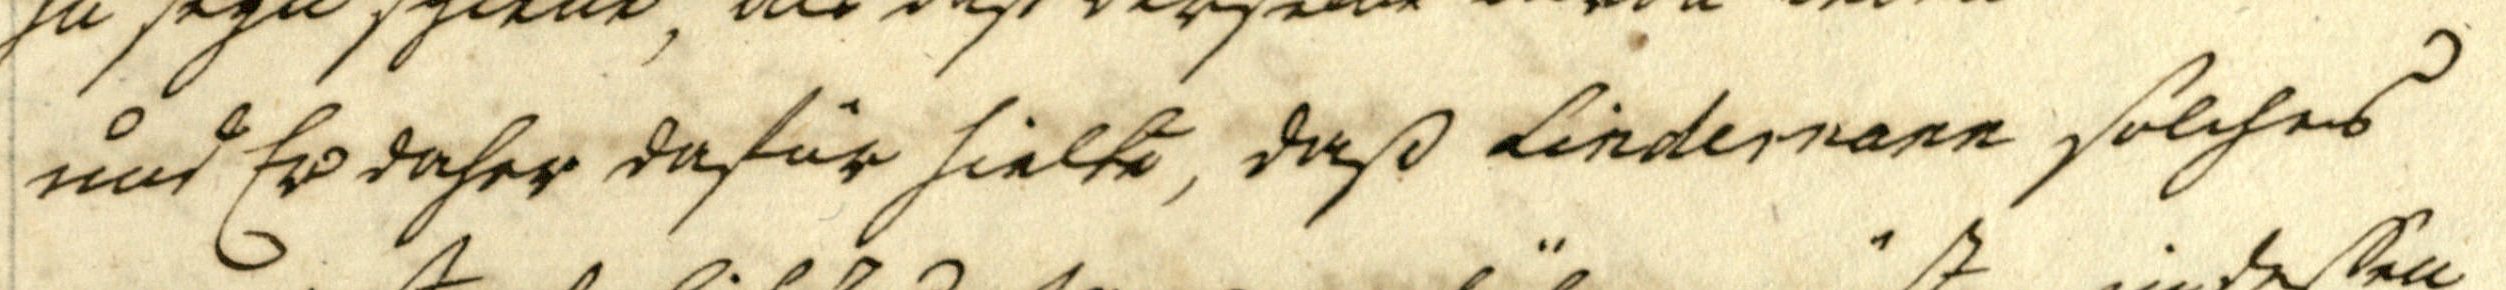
und Er daher dafür hielte, daß Lindemann solches
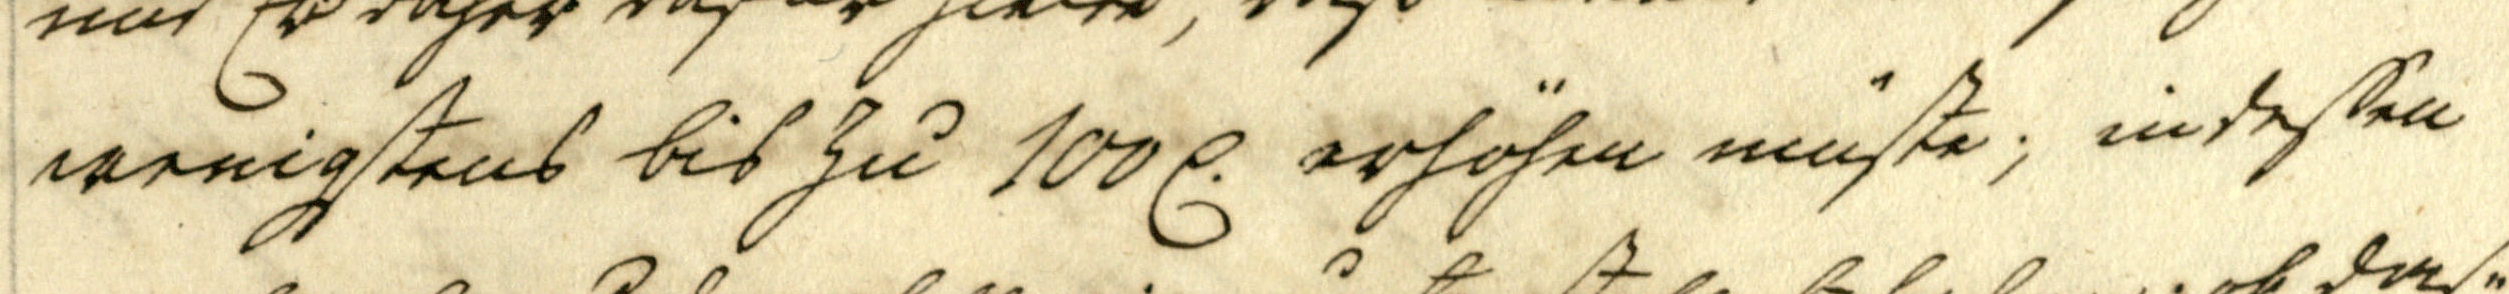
wenigstens bis zu 100 l. erhöhen müsste; indessen
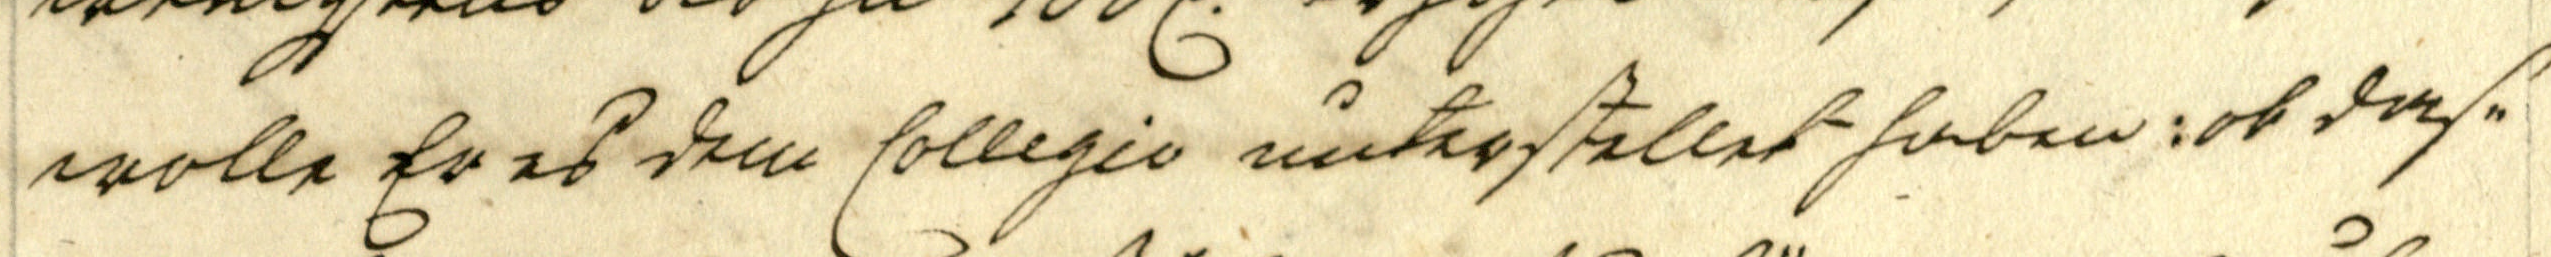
wolle Er es dem Collegio unterstellet haben : ob das¬
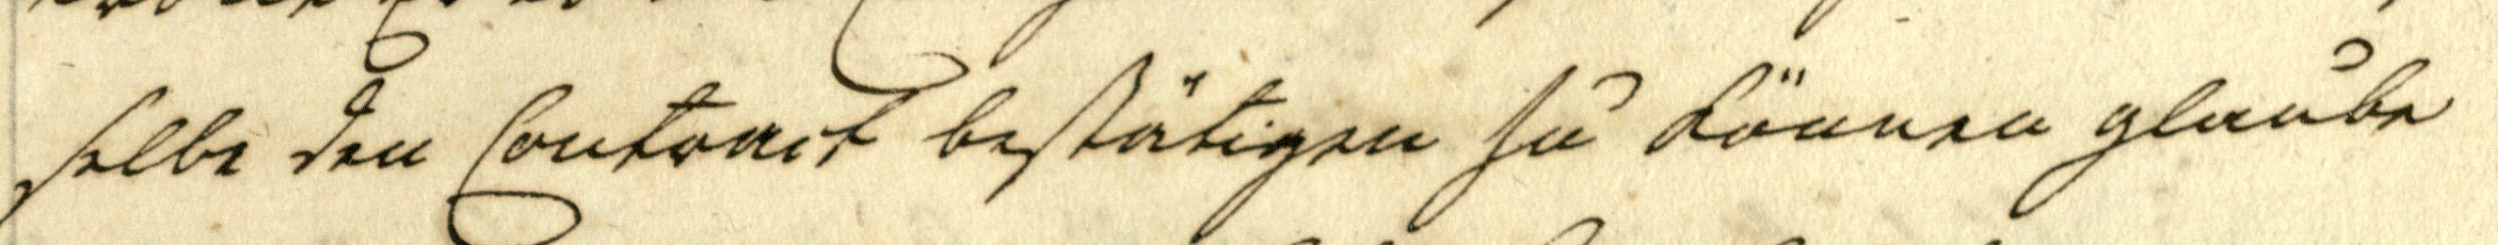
selbe den Contract bestätigen zu können glaube
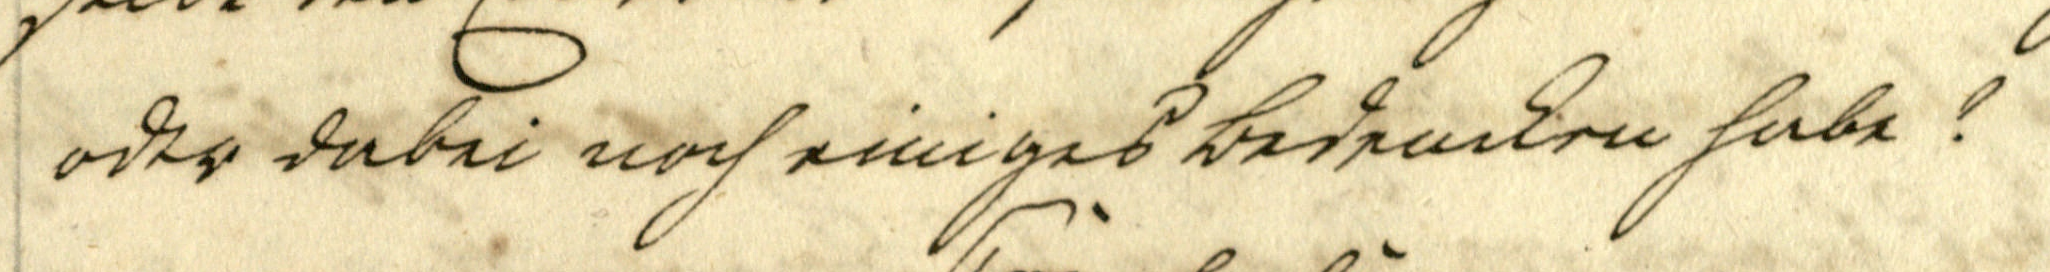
oder dabei noch einiges Bedencken habe?
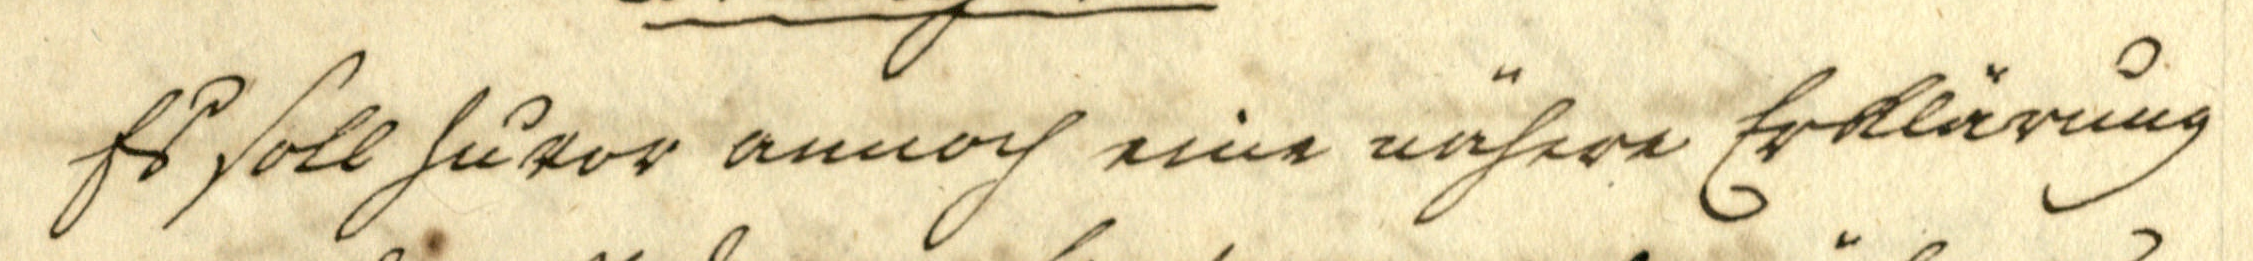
Es soll zuvor annoch eine nähere Erklärung
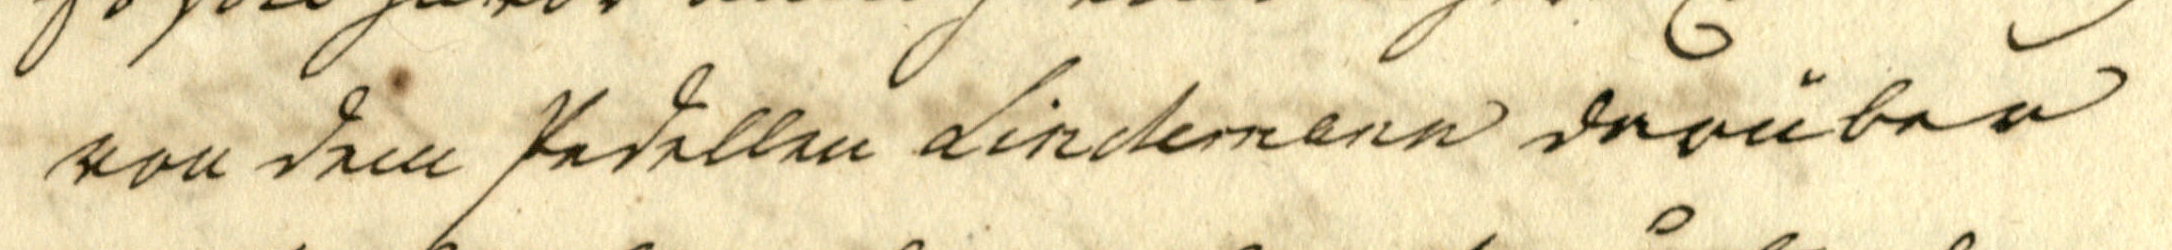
von dem Pedellen Lindemann darüber
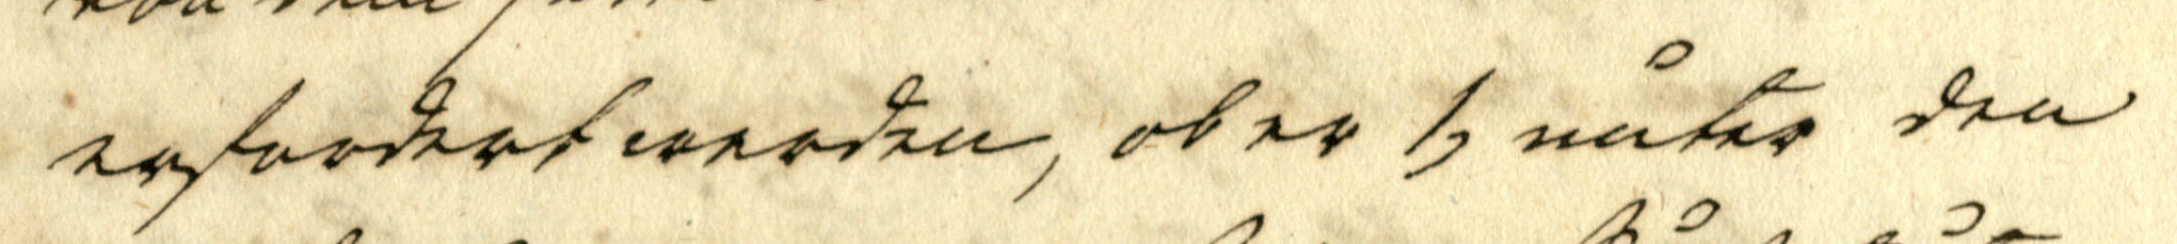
erfordert werden, ob er 1, unter den
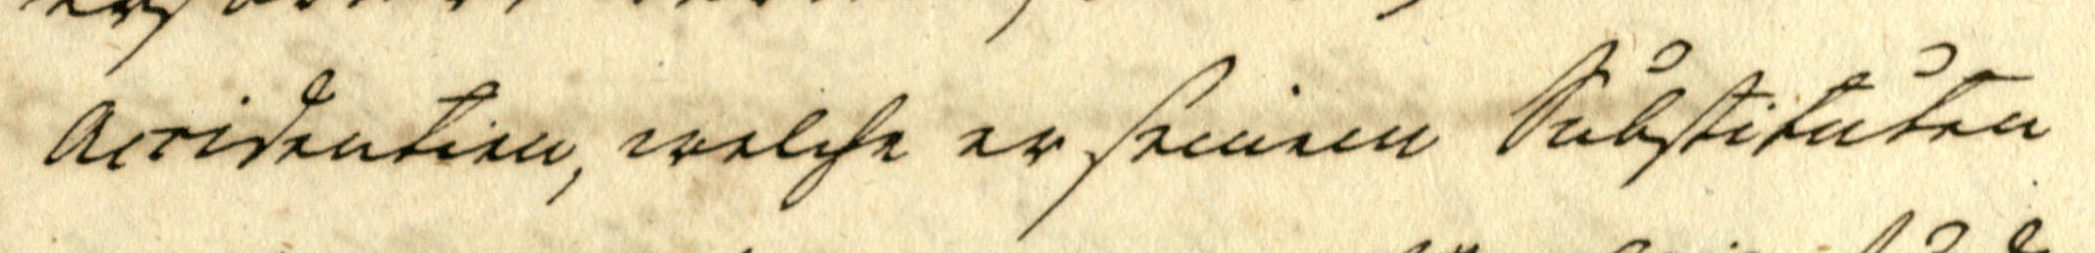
Accidentien, welche er seinem Substituten
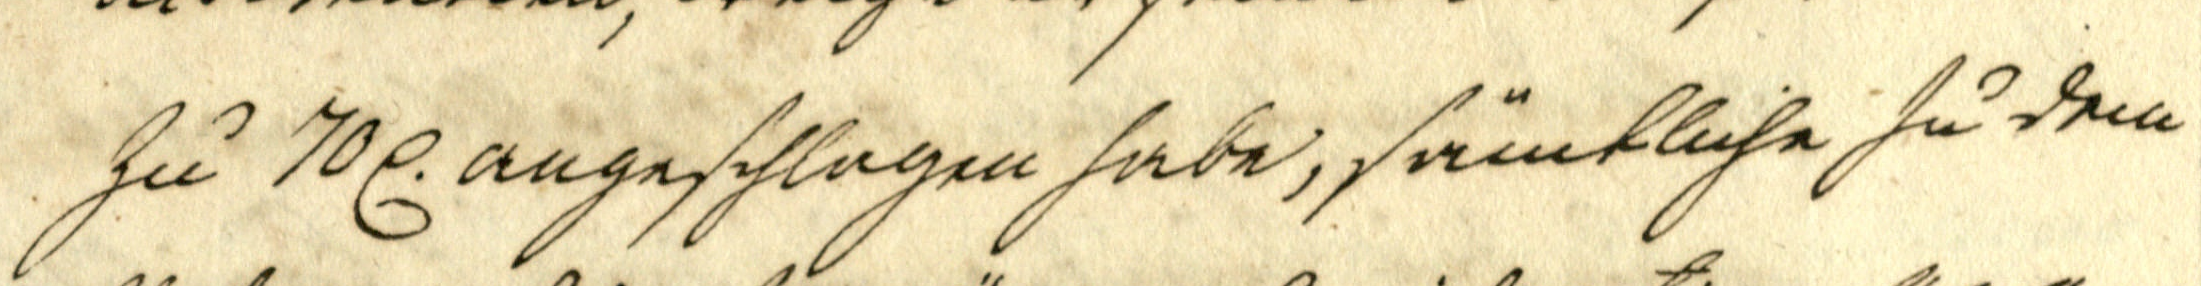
zu 70 l. angeschlagen habe, sämtliche zu dem
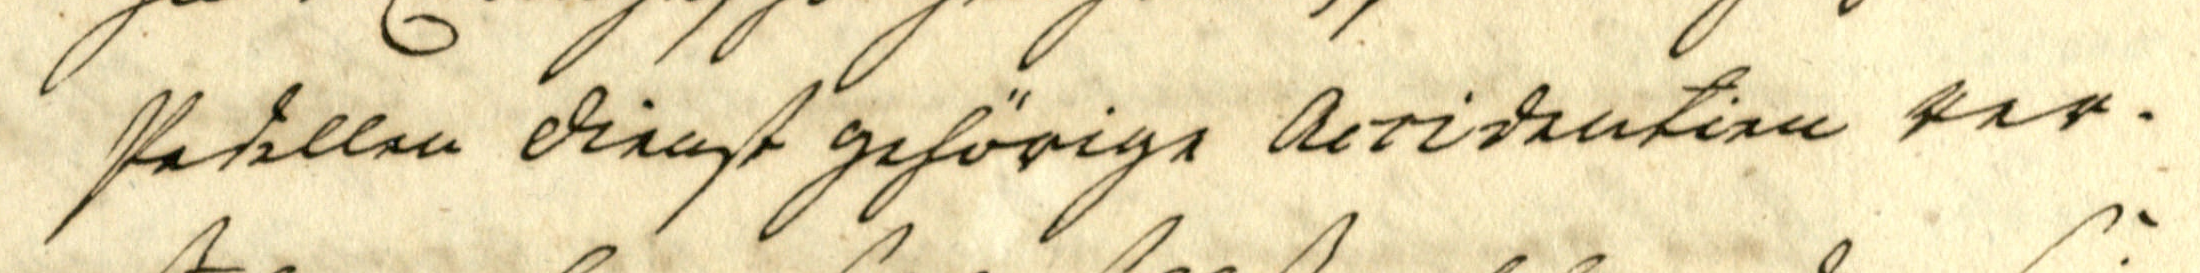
Pedellen Dienst gehörige Accidentien ver¬
